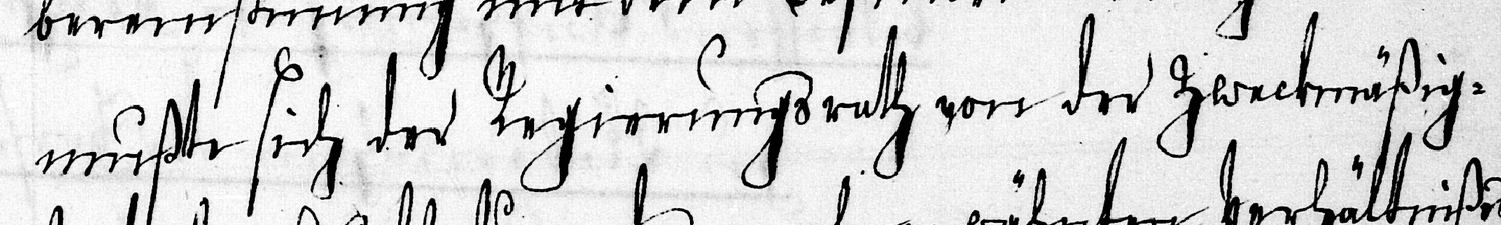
mußte sich der Regierungsrath von der Zweckmäßig¬
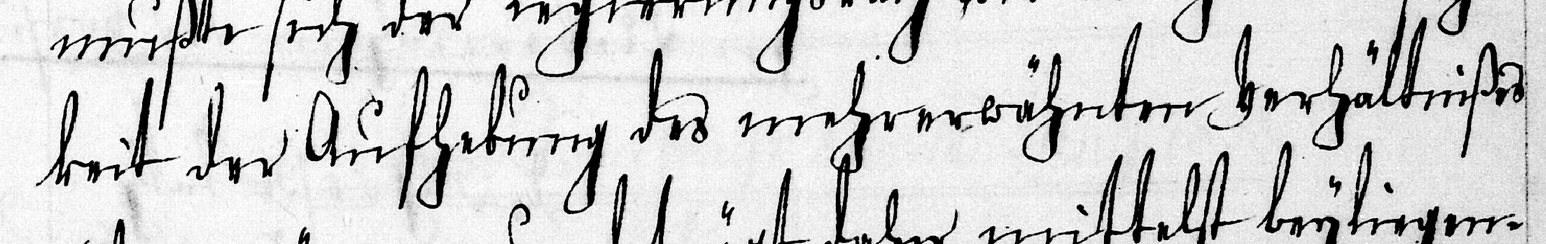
keit der Aufhebung des mehrerwähnten Verhältnißes
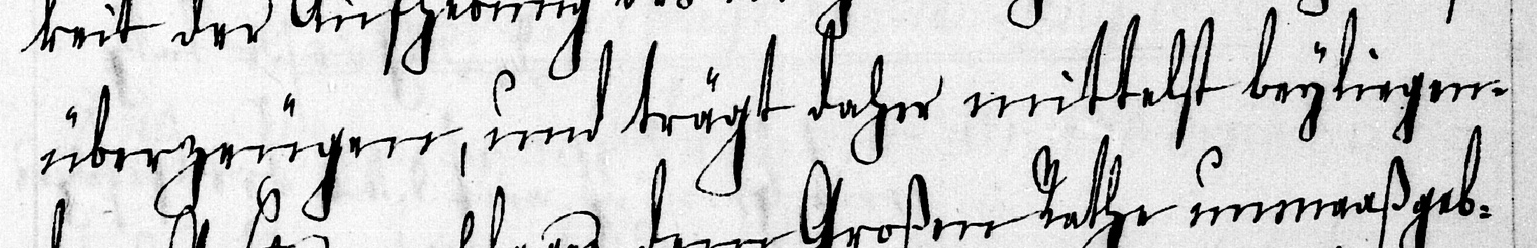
überzeugen, und trägt daher mittelst beyliegen¬
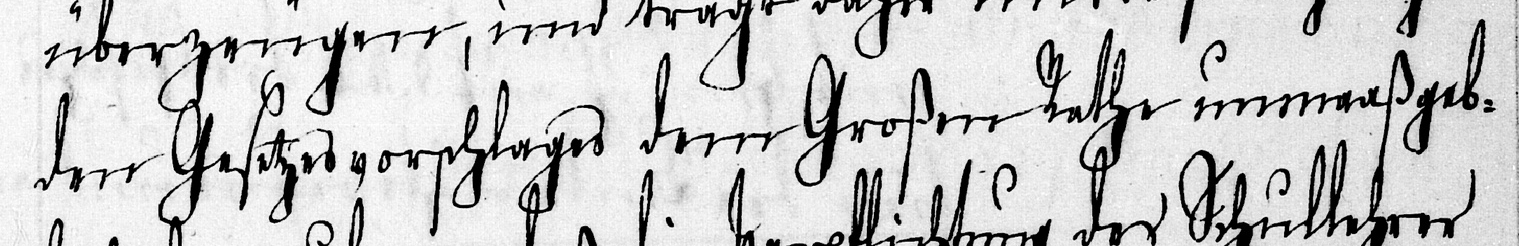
den Gesetzesvorschlages dem Großen Rathe unmaaßgeb¬
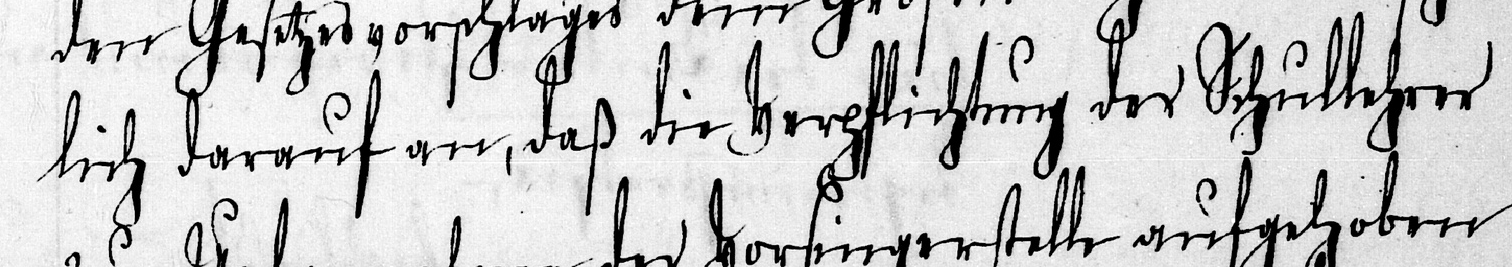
lich darauf an, daß die Verpflichtung der Schullehr¬
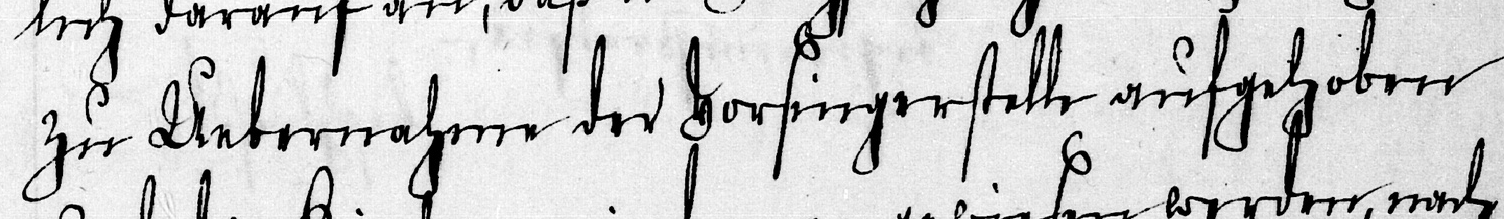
zu Uebernahme der Vorsingerstelle aufgehoben
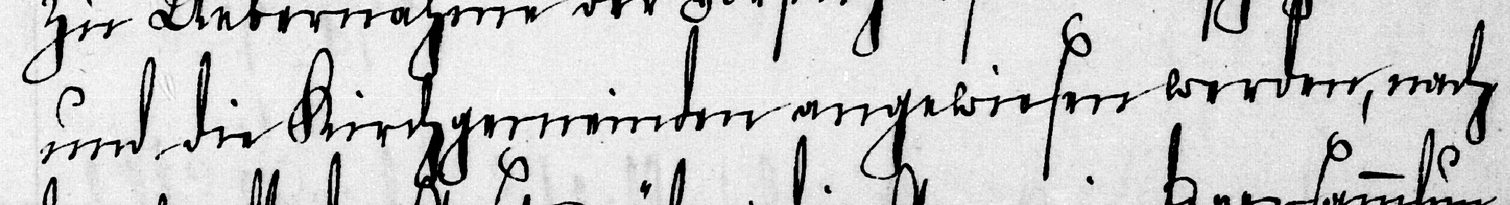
und die Kirchgemeinden angewiesen werden, nach
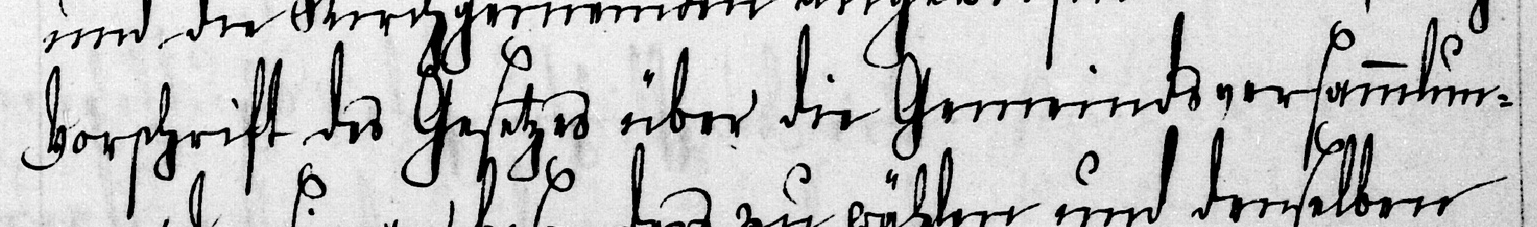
Vorschrift des Gesetzes über die Gemeindsversammlun¬
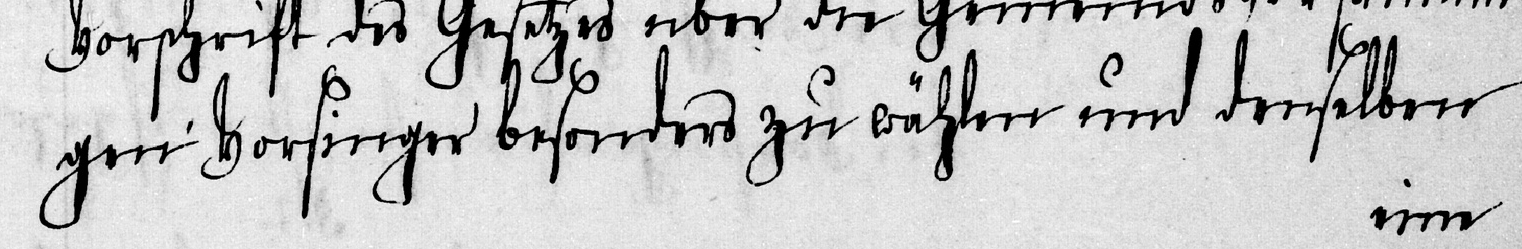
gen Vorsinger besonders zu wählen und denselben
